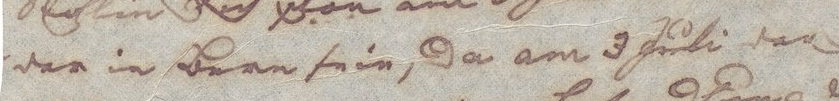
der in Bern sein, da am 3 Juli der
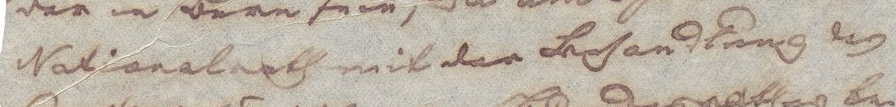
Nationalrath mit der Behandlung des
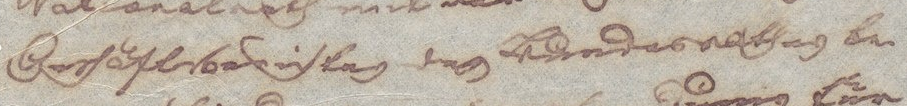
Geschäftsberichtes des Bundesrathes be-
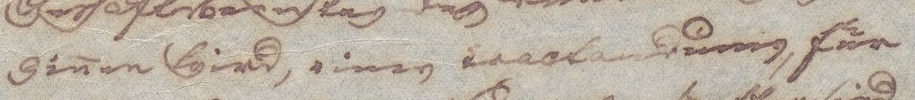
ginnen wird, eines Tractandums, für
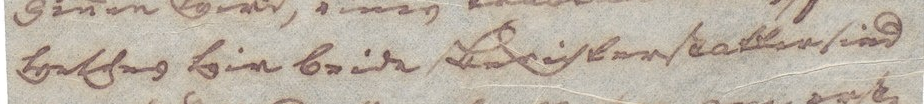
welches wir beide Berichterstatter sind
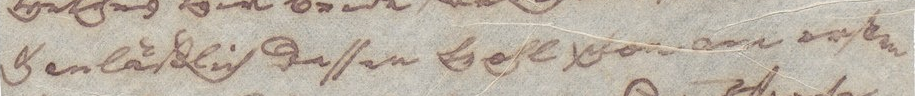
& anläßlich dessen wohl schon am ersten
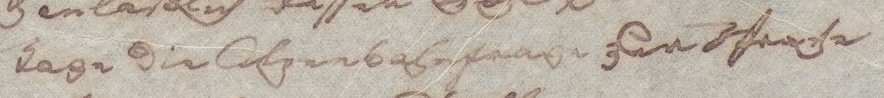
Tage die Alpenbahnfrage zur Sprache
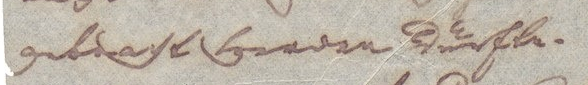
gebracht werden dürfte.
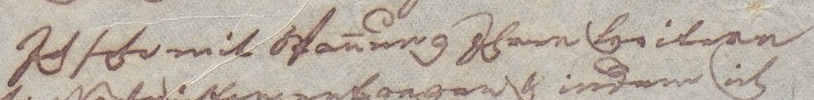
Ich sehe mit Spannung Ihren weitern
